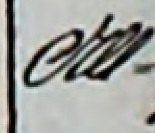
Alt
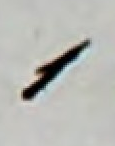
1
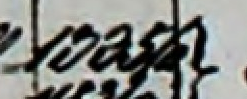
1335/a
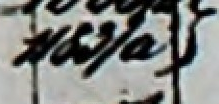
1183/a
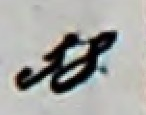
58
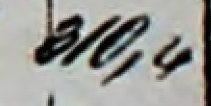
310,4
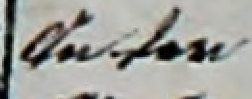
An der
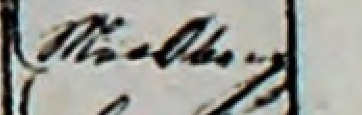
Moosberg
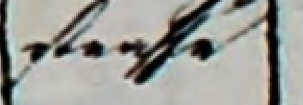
st?asse
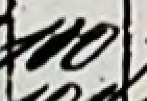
110
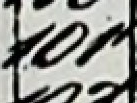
101
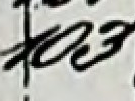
103
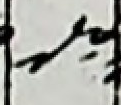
do
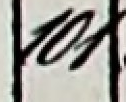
101
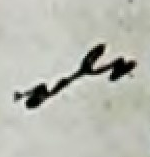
do
